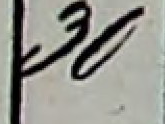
30
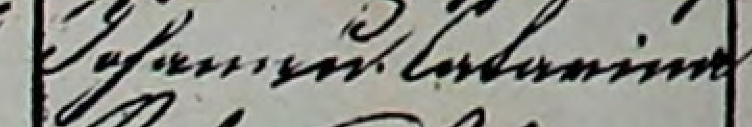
Johann u. Catarina
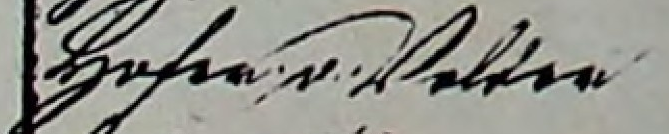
Hofer v. Vetter
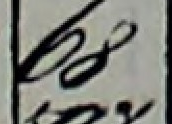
68
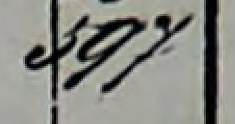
597
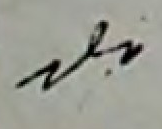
do
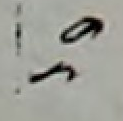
2
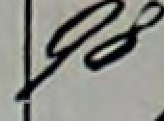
98
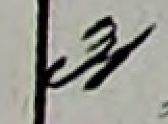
31
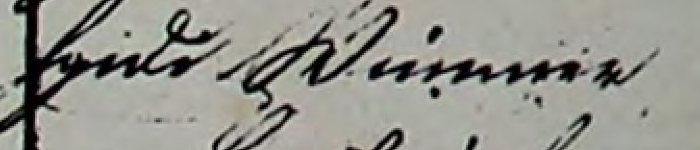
Egide Wimmer
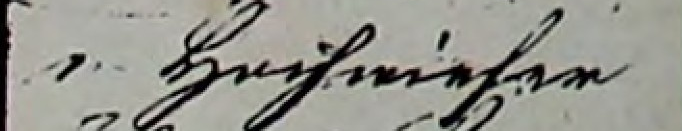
v. Hochwieser
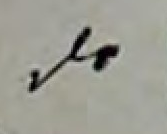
do
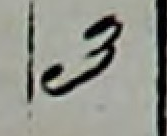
3
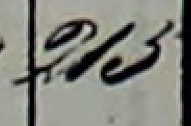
215
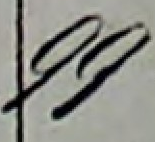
99
